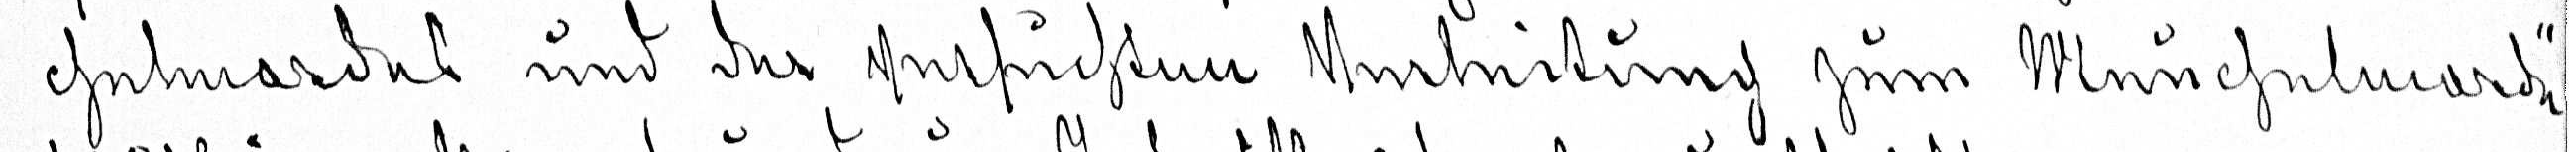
chelmordes und der versuchten Verleitung zum Meuchelmordes
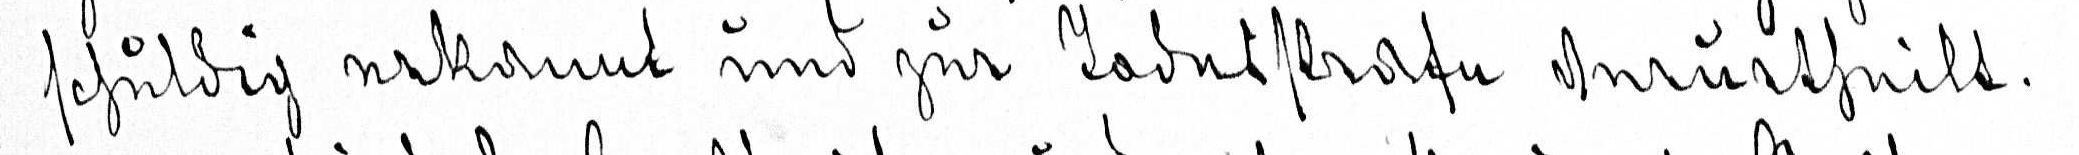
schuldig erkannt und zur Todesstrafe verurtheilt.
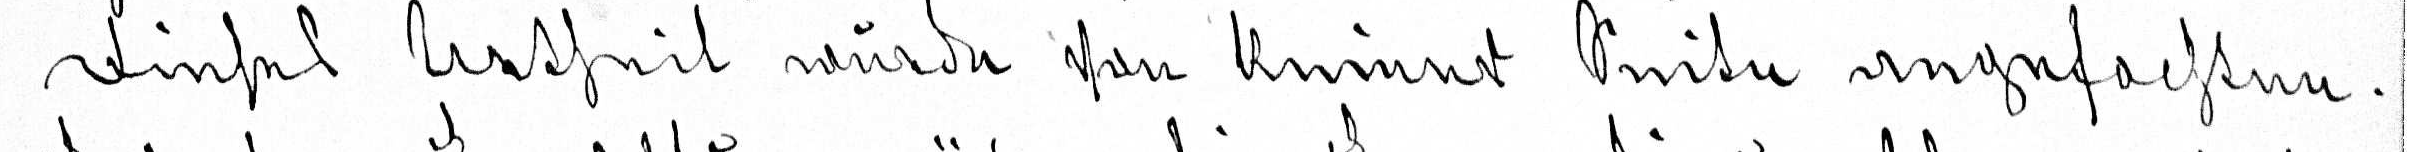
Dieses Urtheil wurde von Keiner Seite angefochten.
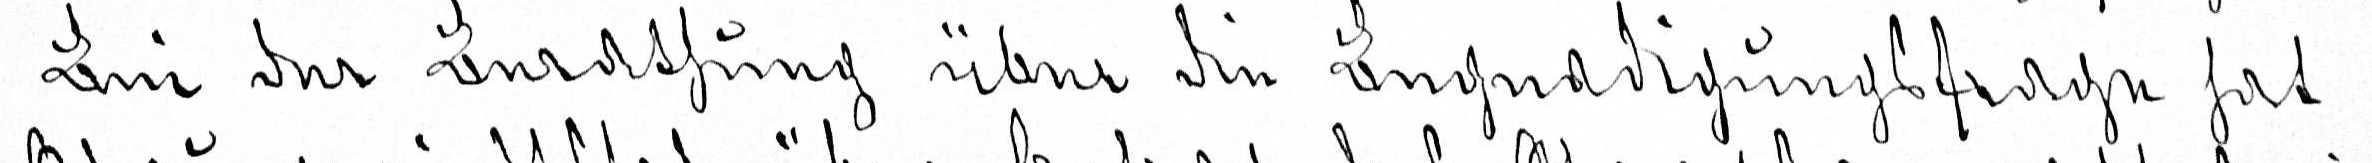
Bei der Berathung über die Begandigungsfrage hat
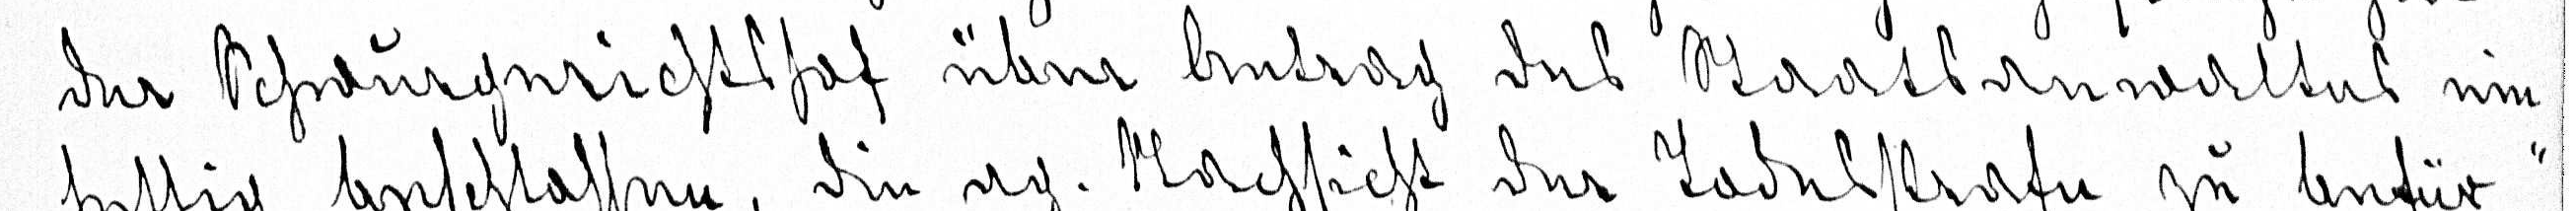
der Schwurgerichtshof über Antrag des Staatsanwaltes ein¬
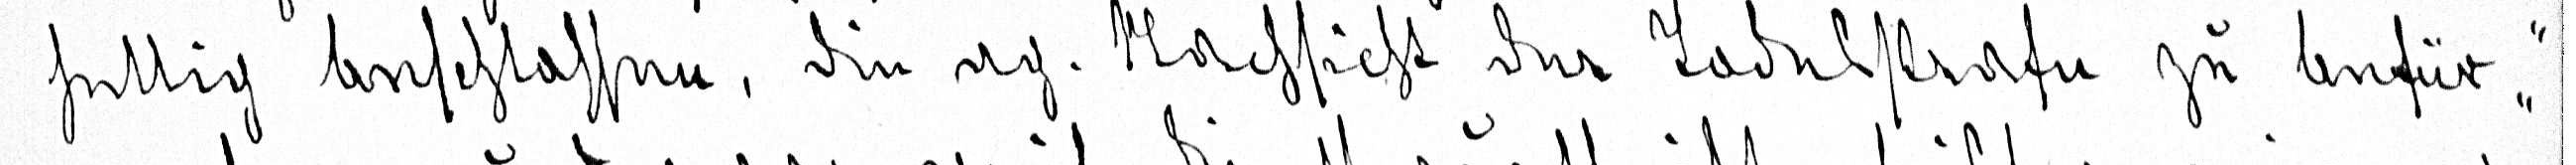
hellig beschlossen, die ag. Nachsicht der Todesstrafe zu befür¬
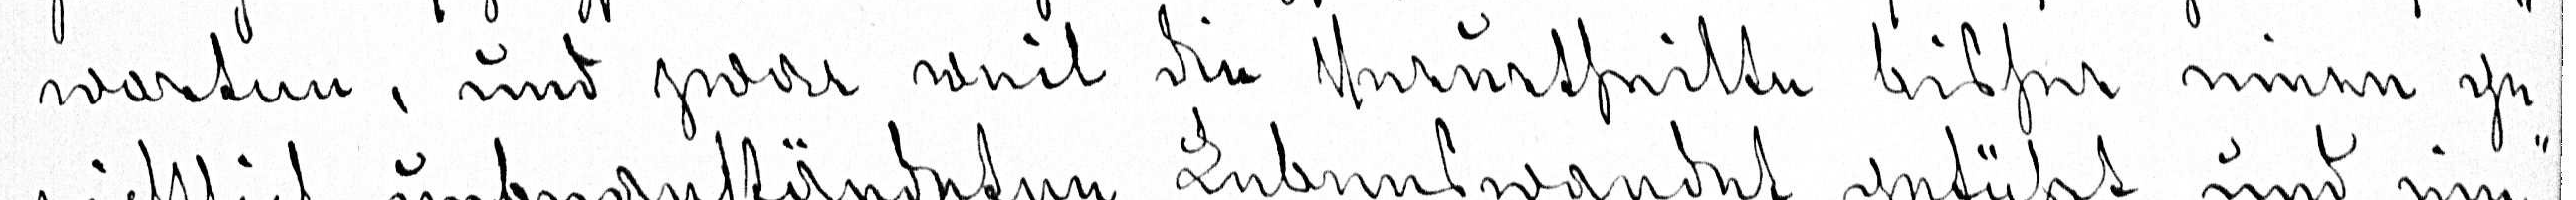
worten, und zwar weil die Verurtheilte bisher einen ge¬
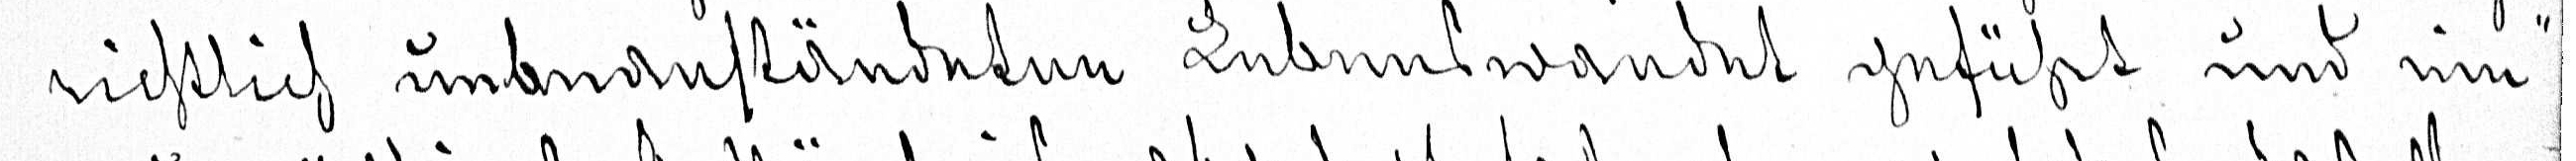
richtlich unbeanständeten Lebenswandel geführt und ein
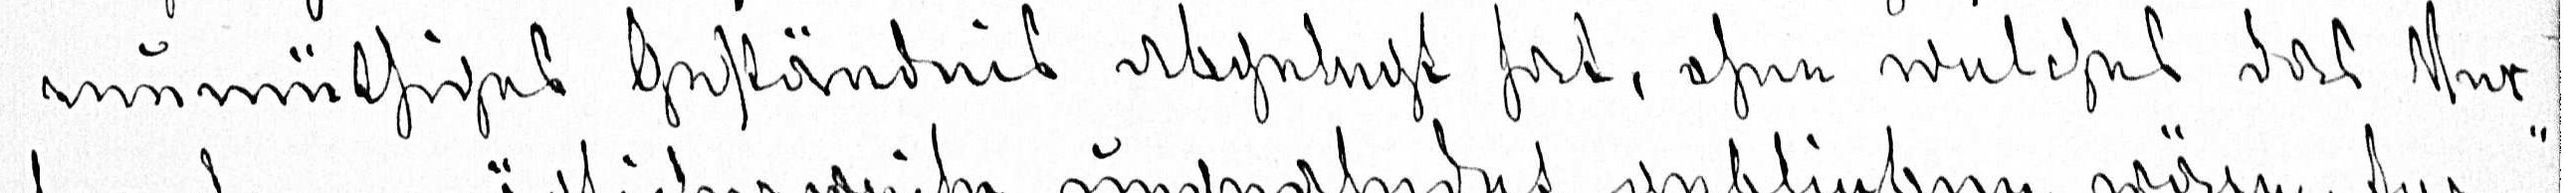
reumüthiges Geständnis abgelegt hat, ohne welches das Ver¬
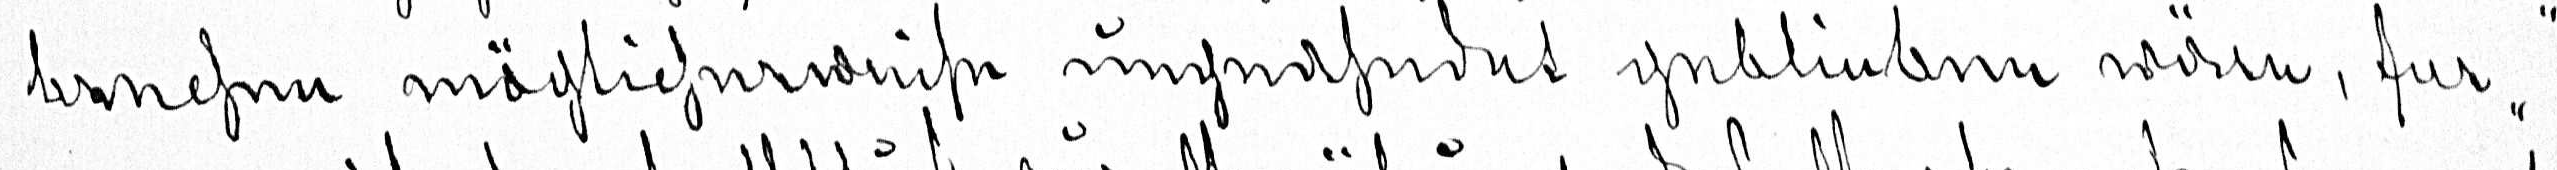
brechen möglicherweise ungeahndet geblieben wäre, fer¬
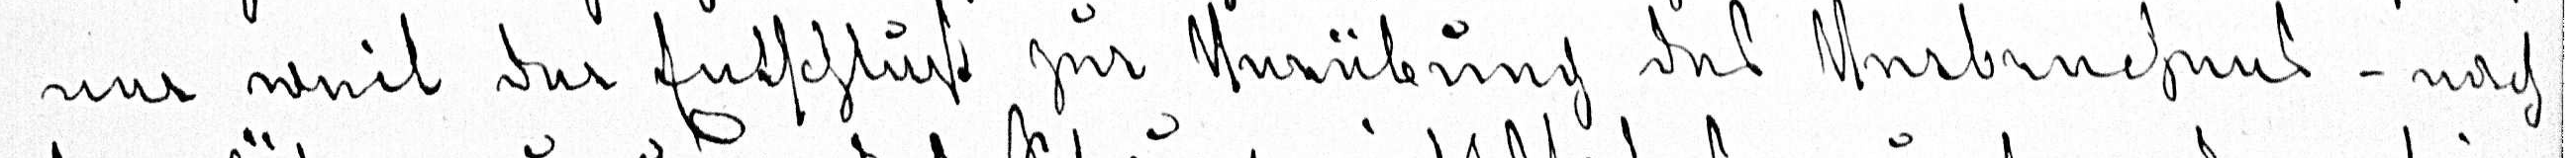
ner weil der Entschluß zur Verübung des Verbrechens – nach
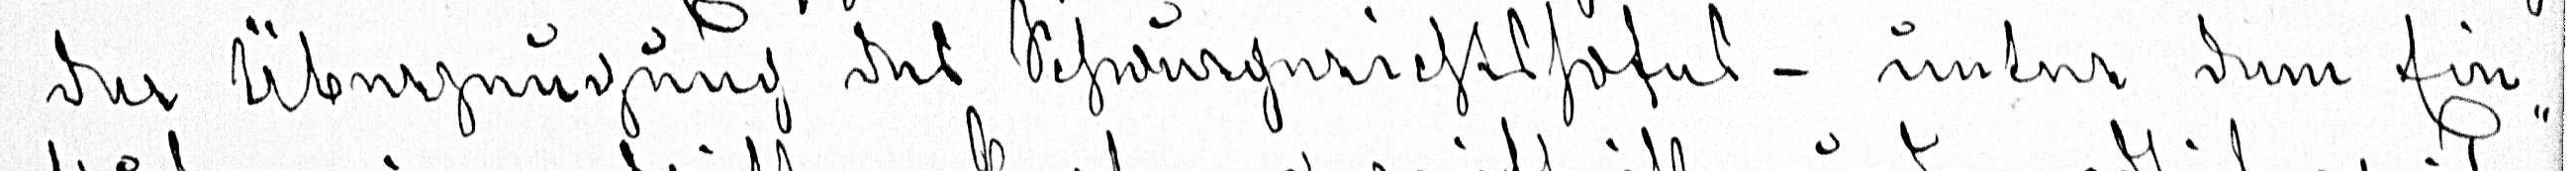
der Überzeugung des Schurgerichtshofes – unter dem Ein¬
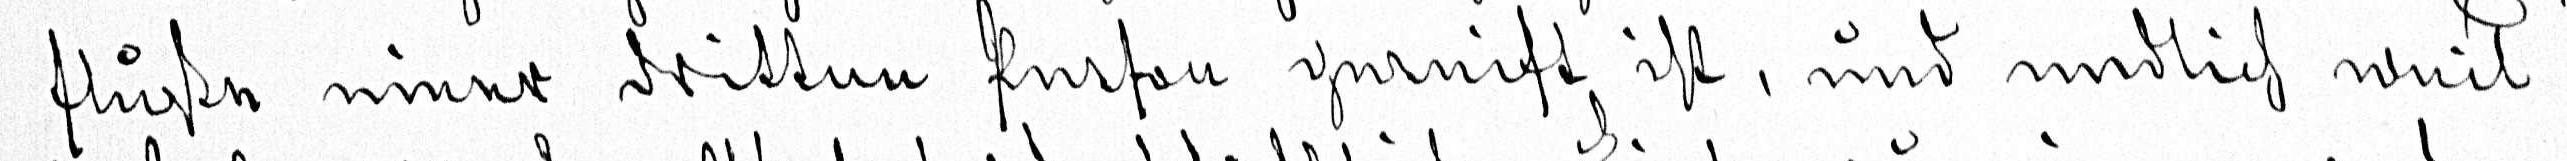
fluße einer dritten Person gereift ist, und endlich weil
